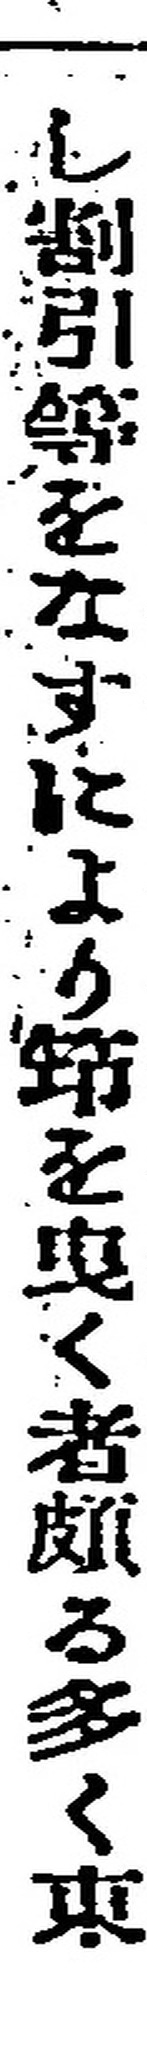し割引等をなすにより笻を曳く者頗る多く東
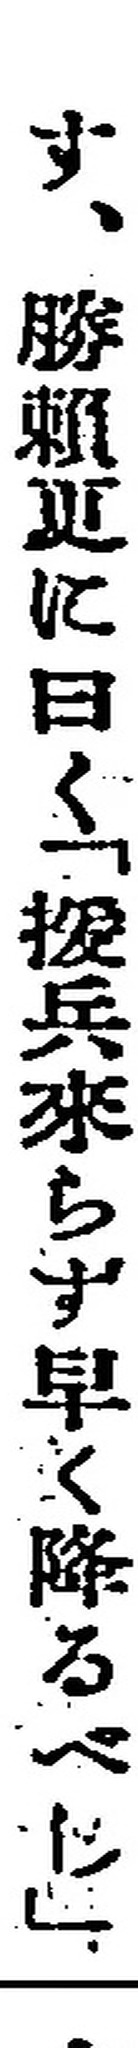す、勝頼更に曰く「援兵来らず早く降るべし」
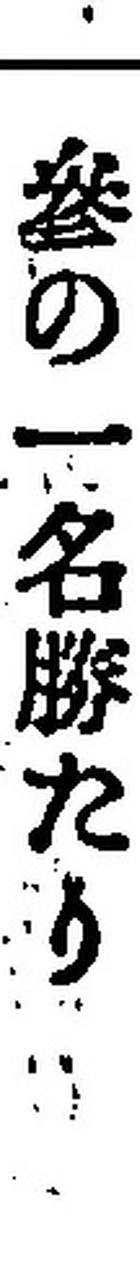参の一名勝たり
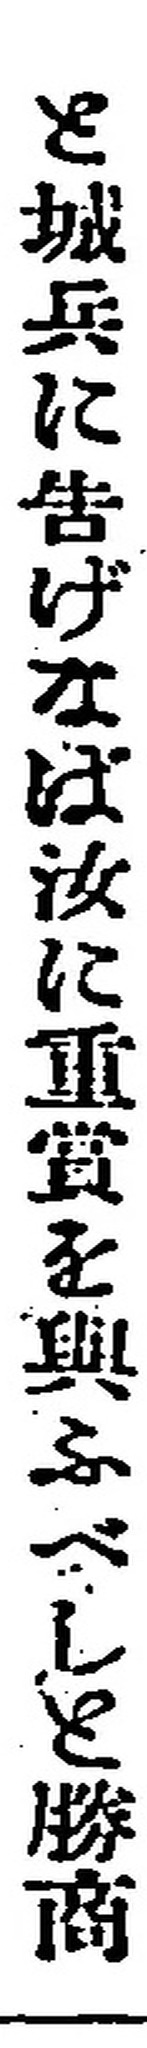と城兵に告げなば汝に重賞を与ふべしと勝商
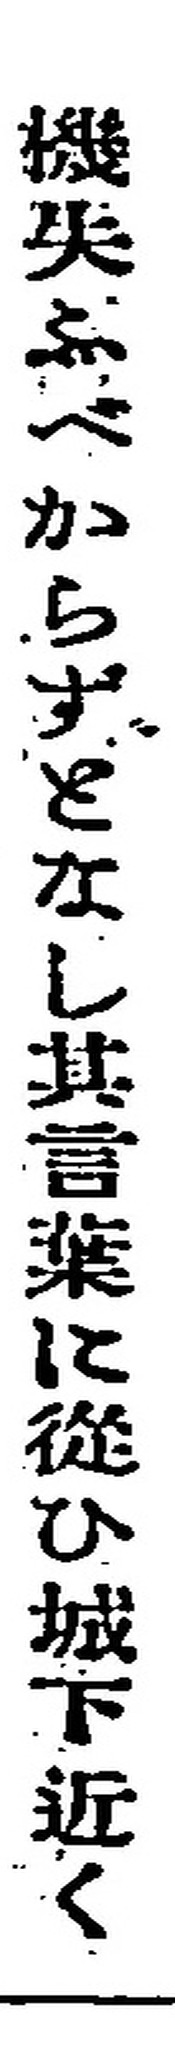機失ふべからずとなし其言葉に従ひ城下近く
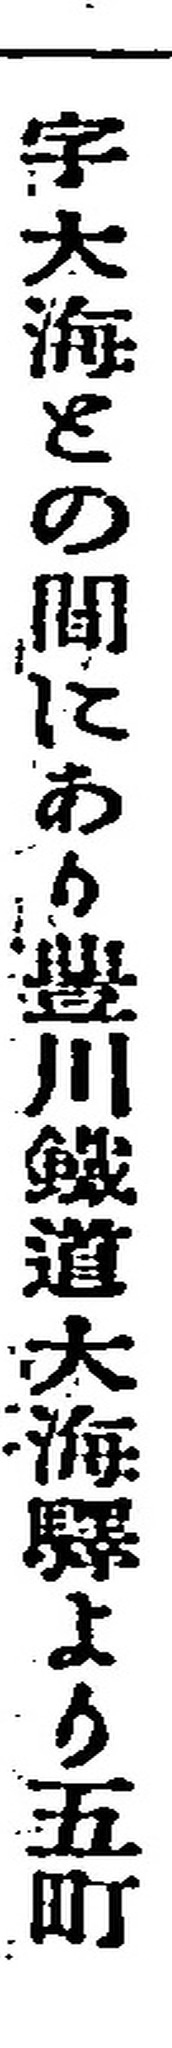字大海との間にあり豊川鉄道大海駅より五町
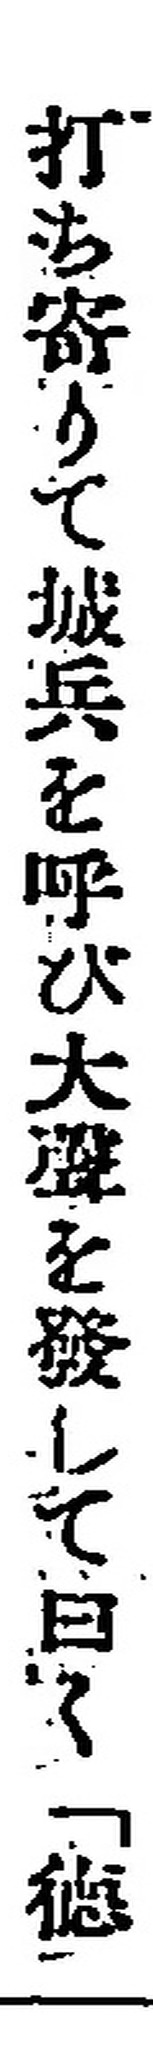打ち寄りて城兵を呼び大声を発して曰く「徳
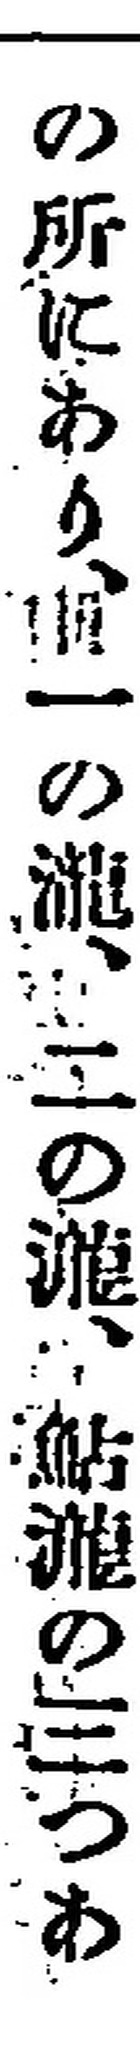の所にあり、一の瀧、二の滝、鮎瀧の三つあ
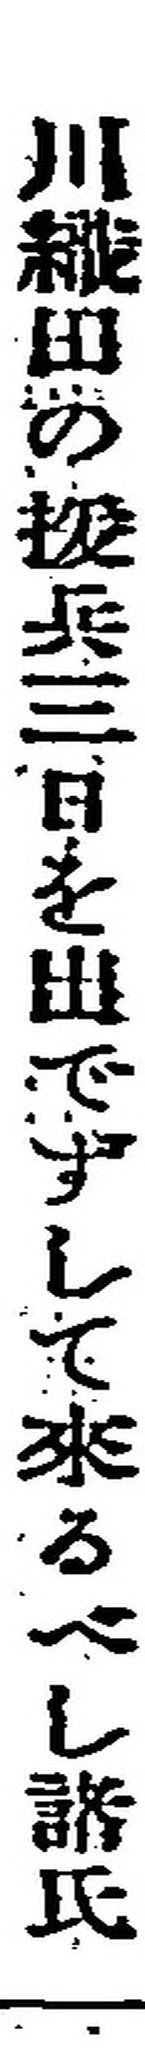川織田の援兵三日を出でずして来るべし諸氏
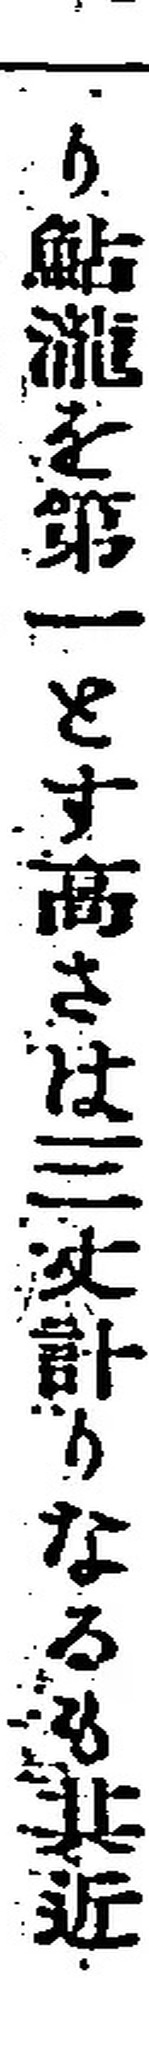り鮎瀧を第一とす高さは三丈計りなるも其近
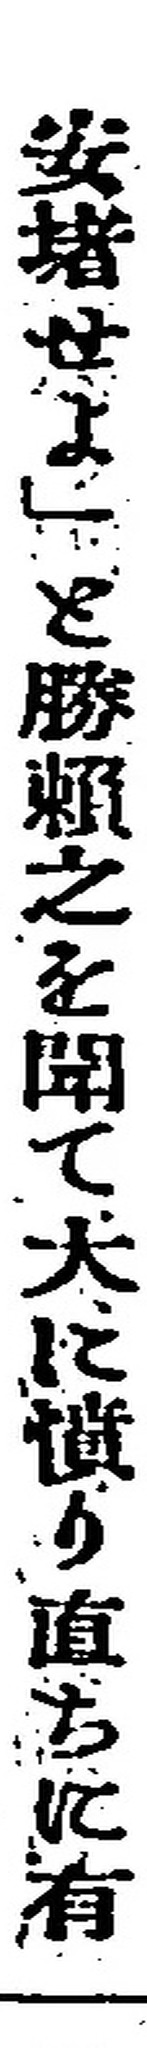安堵せよ」と勝頼之を聞て大に憤り直ちに有
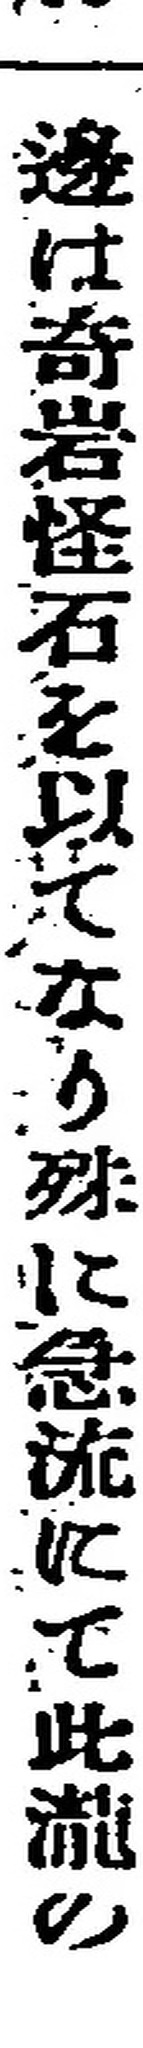辺は奇岩怪石を以てなり殊に急流にて此瀧の
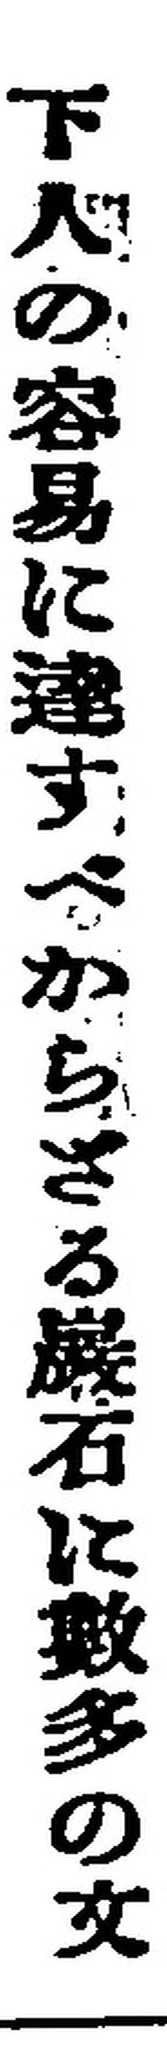下人の容易に達すべからざる巌石に数多の文
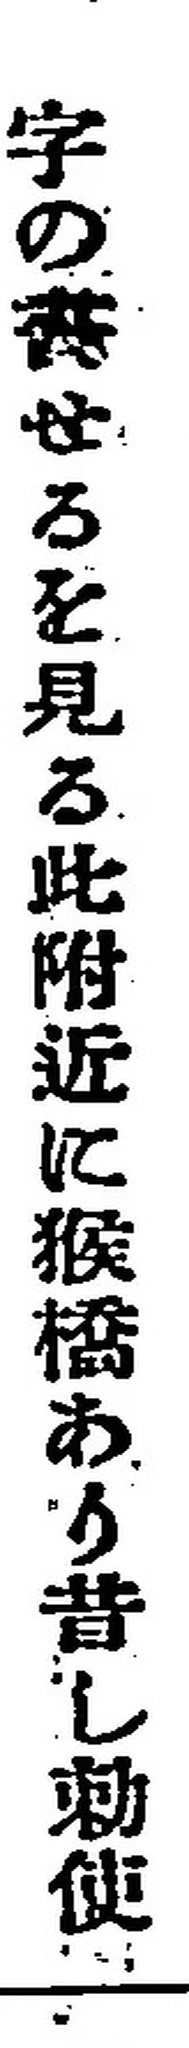字の書せるを見る此附近に猴橋あり昔し勅使
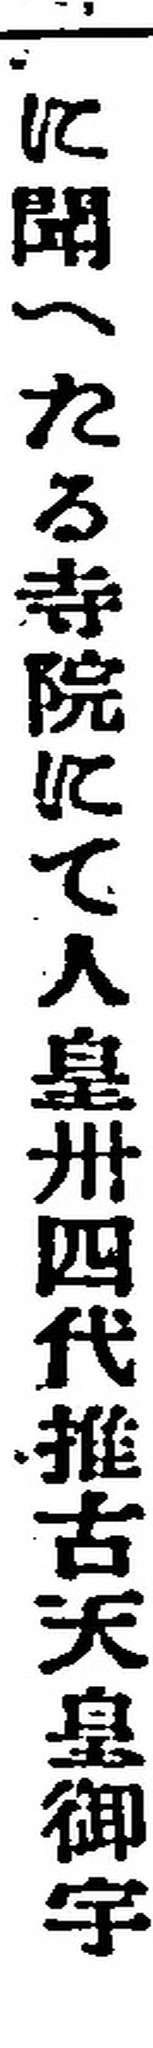に聞へたる寺院にて人皇卅四代推古天皇御宇
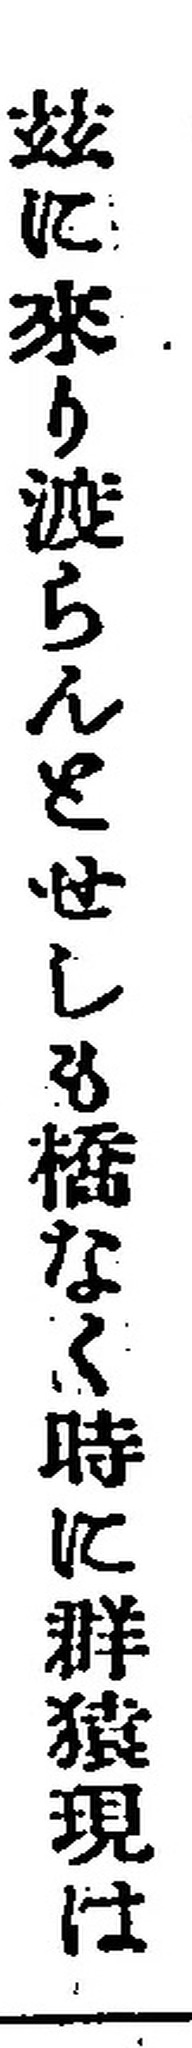茲に来り渡らんとせしも橋なく時に群猿現は
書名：東参名勝案内
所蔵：国立国会図書館 National Diet Library, JAPAN
